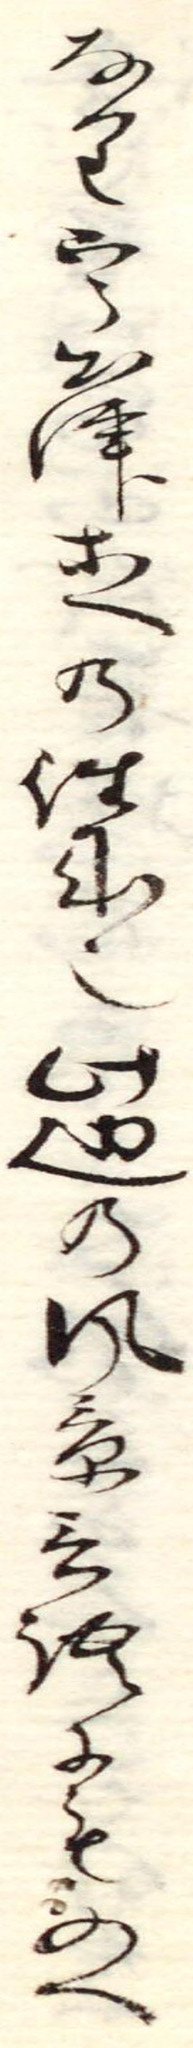なり宇出津等への往来也此辺の風景げ言語にものへ
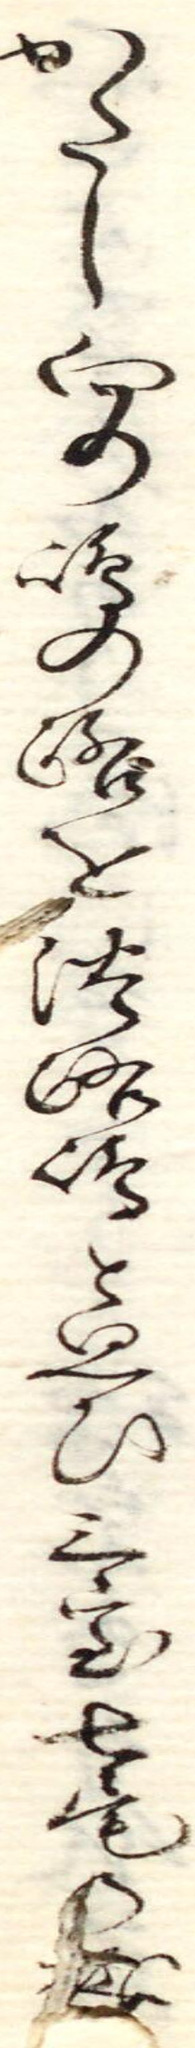かたし向の嶋の路を淡路嶋と思ひ三室七尾の
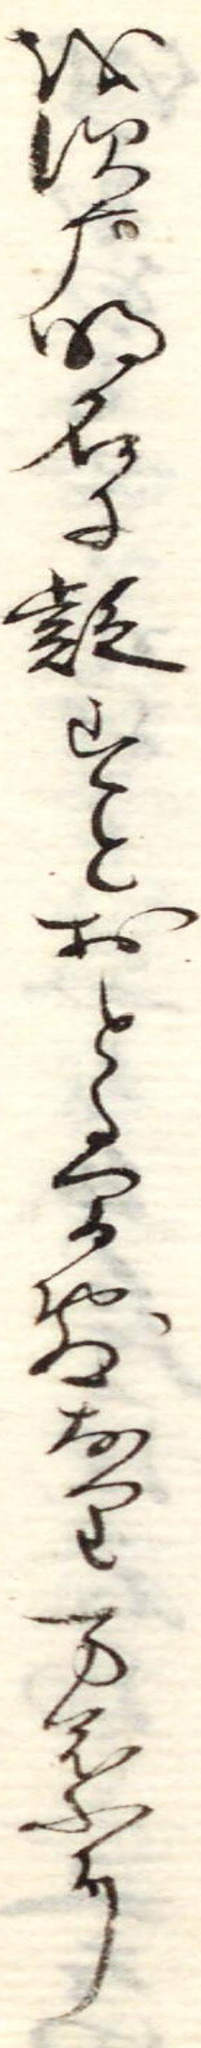を須磨明石に疑すとおとる間敷なり万葉に
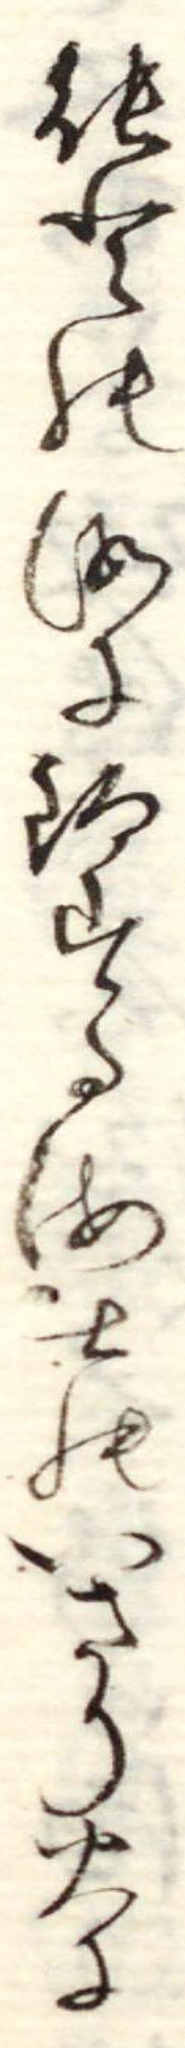能登の海に釣する海士のいさり火に
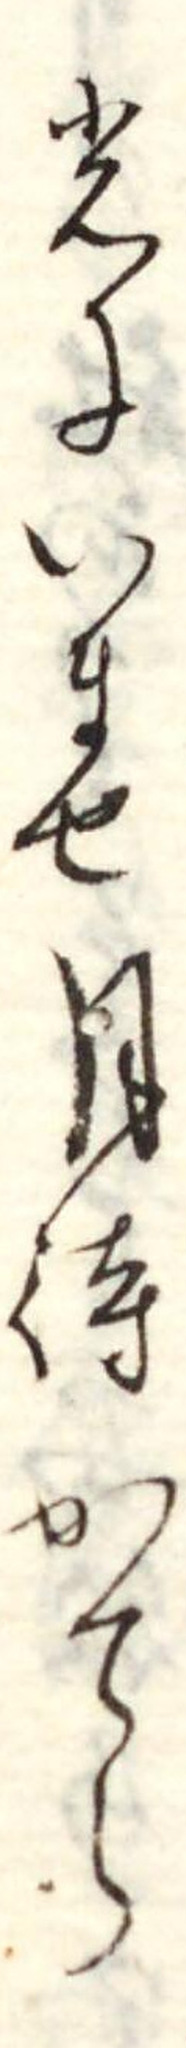光にいませ月待かてら
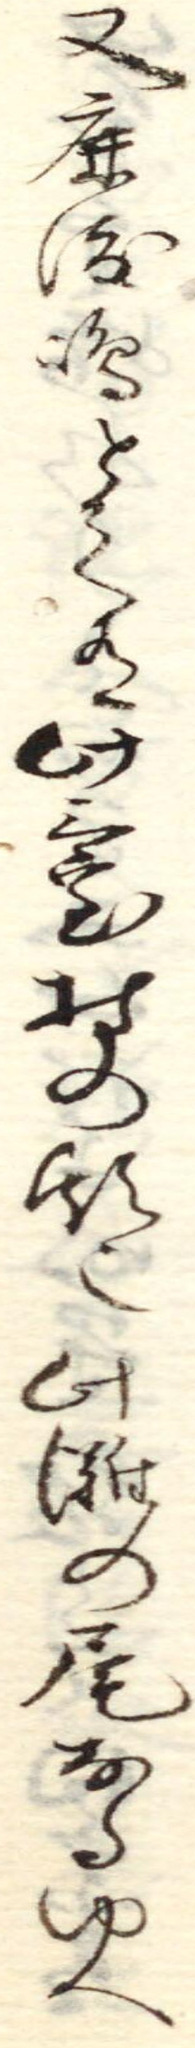又鹿渡嶋とて有此三室村の領也此灘の尾なるゆへ
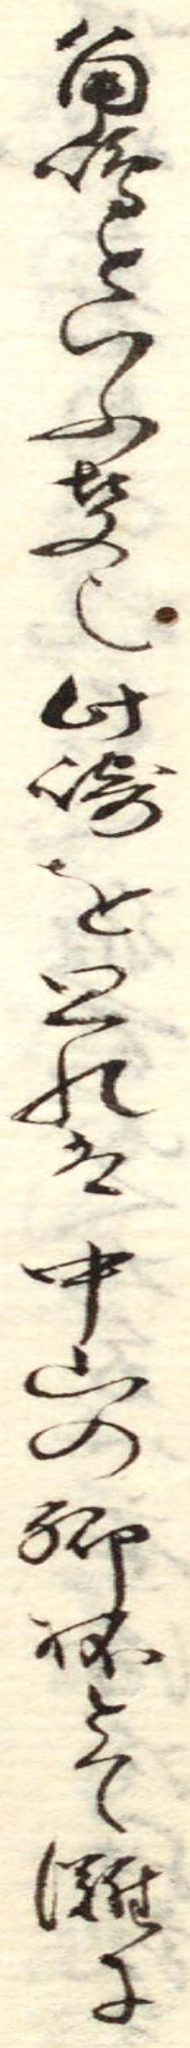角嶋といふ事也此崎を廻れは中山の郷抔とて灘に
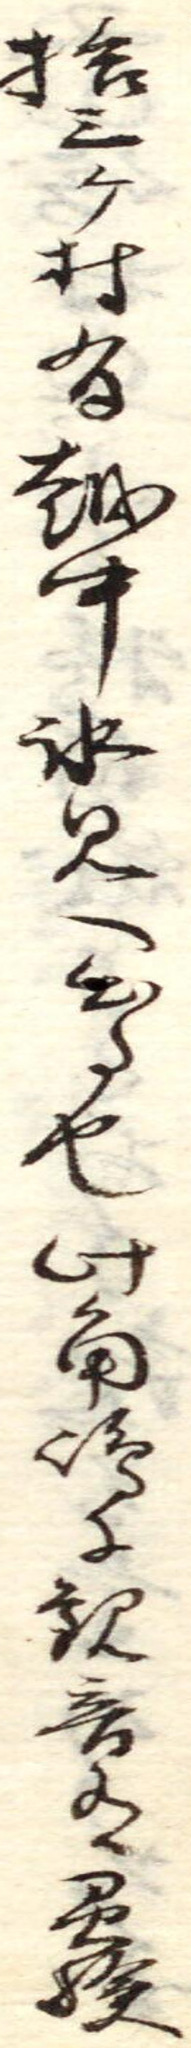拾三ヶ村有越中氷見へ出る也此角嶋に観音有霊験
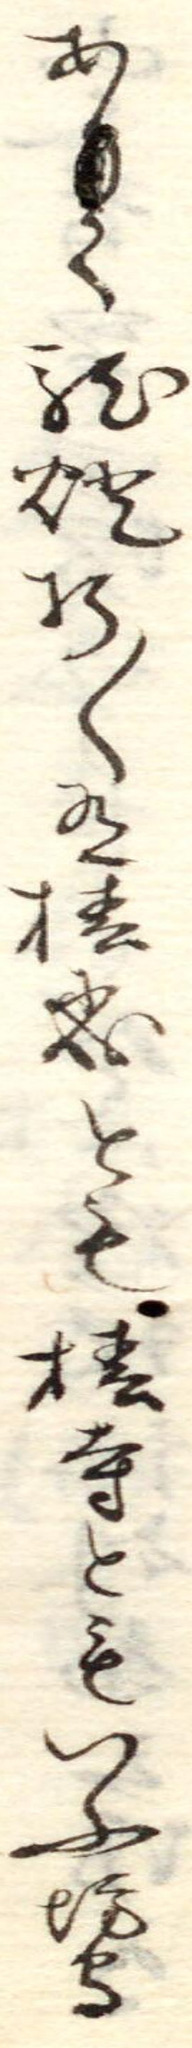ありて龍燈折〳〵有椿森とも椿寺ともいふ坊寺
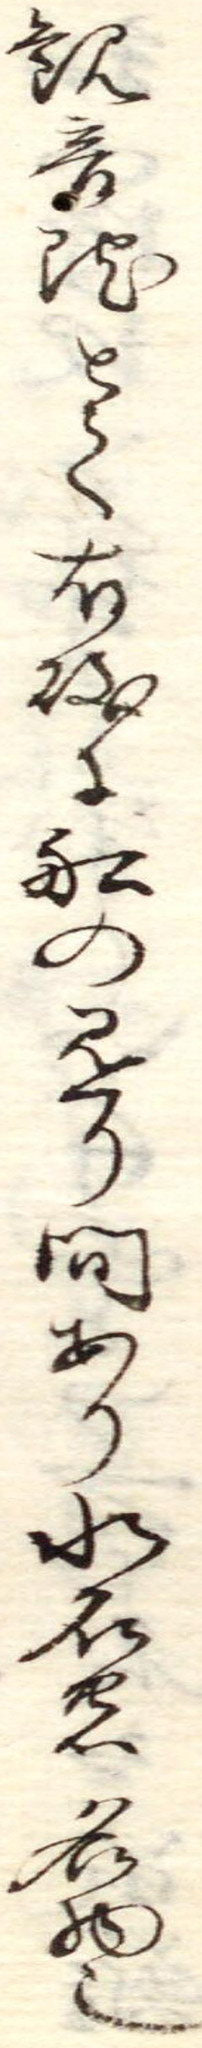観音院とて有礒に船の懸り間あり水石の名物也
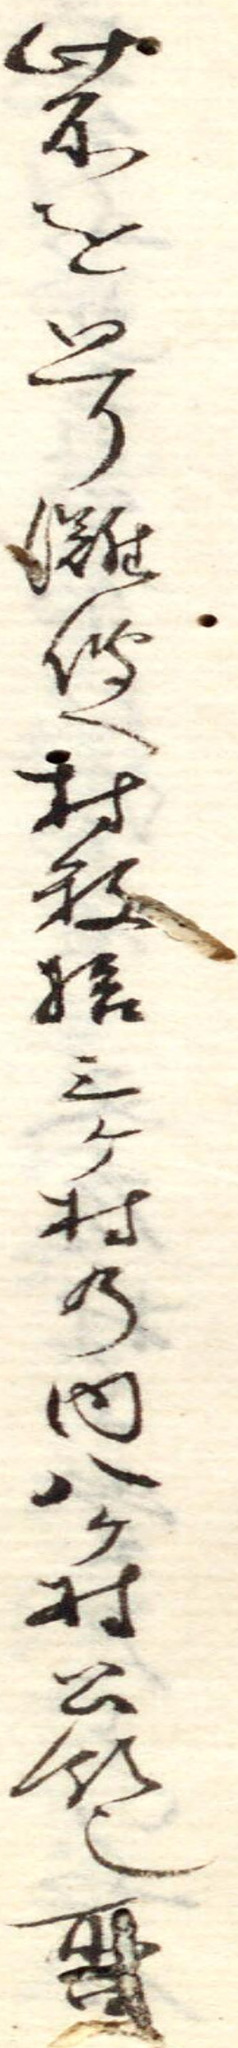此所を廻り灘伝へ村数拾三ヶ村の内八ヶ村公領也所口
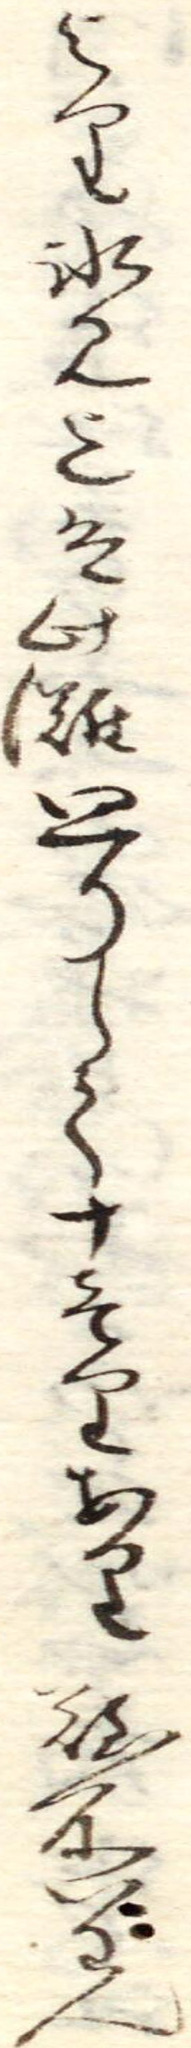より氷見迄は此灘廻りして十壱里あり難所いわん
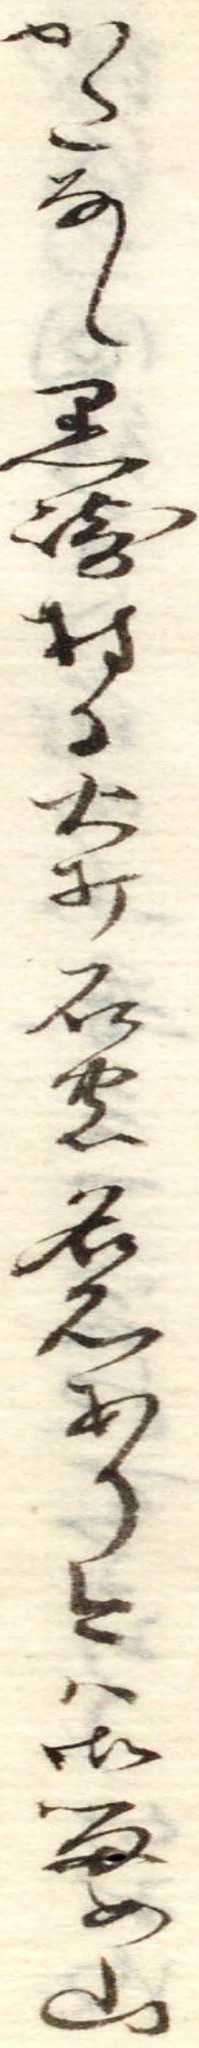かたなし黒崎村に火打石の名石あり今は御留め山
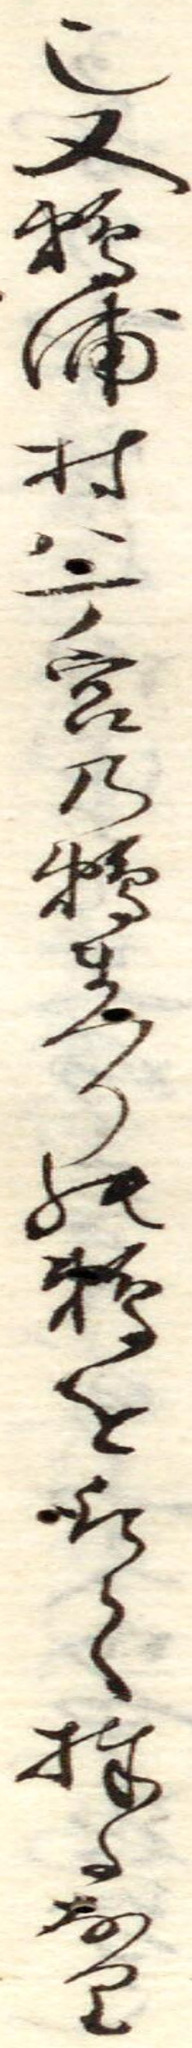也又鵜浦村は一ノ宮の鵜まつりの鵜を取て捧るなり
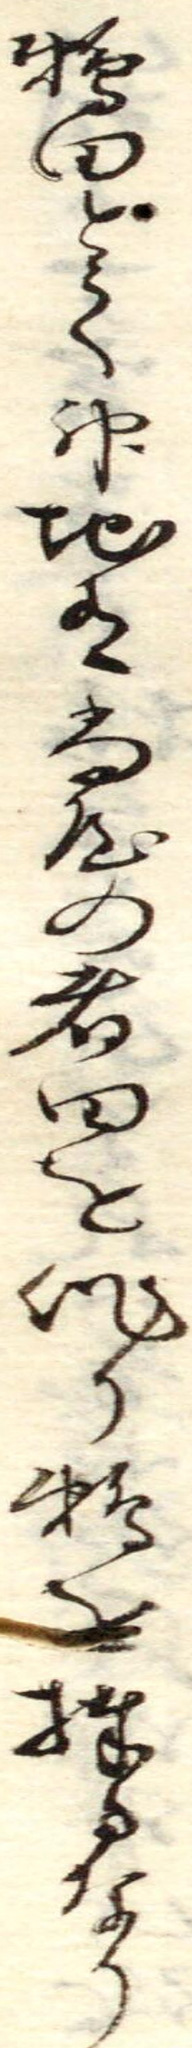鵜田とて神地有当屋の者田を作り鵜を捧るなり

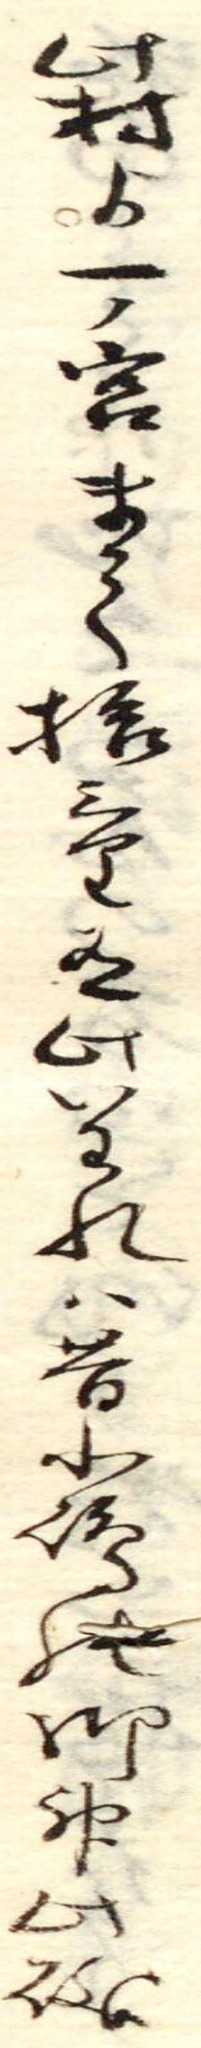此村ゟ一ノ宮まて拾三里有此いわれは昔小嶋の御神此礒
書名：能登名跡誌
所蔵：Ishikawa Prefectural Library
